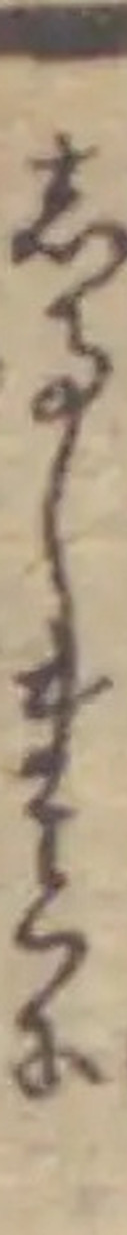しるしまことに
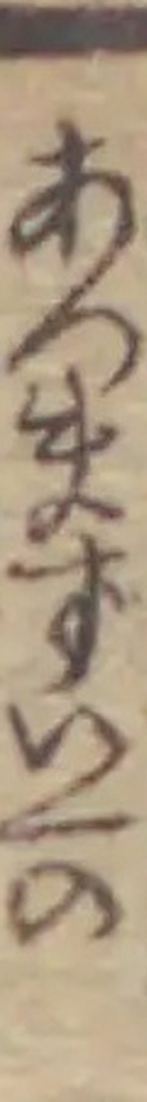あつまずい一の
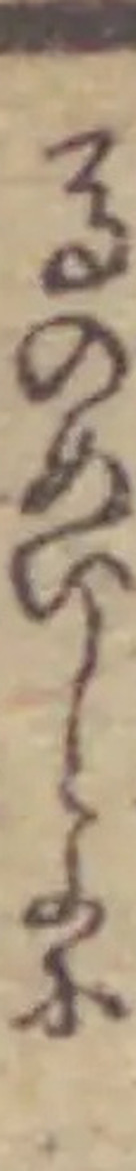馬のめいしよに
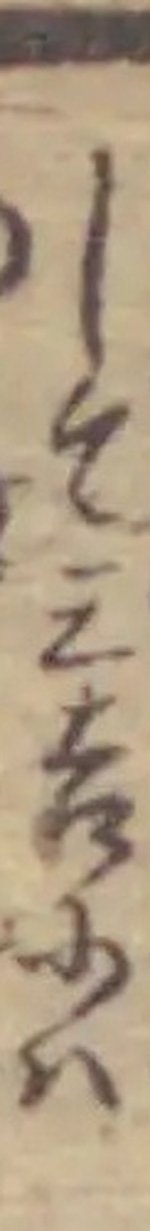して三吉には
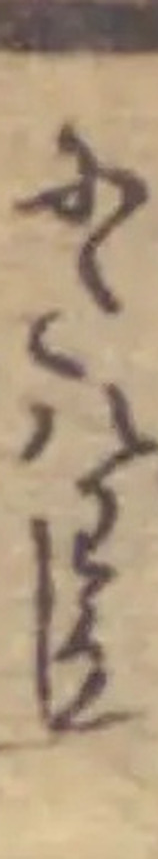にた八わうし
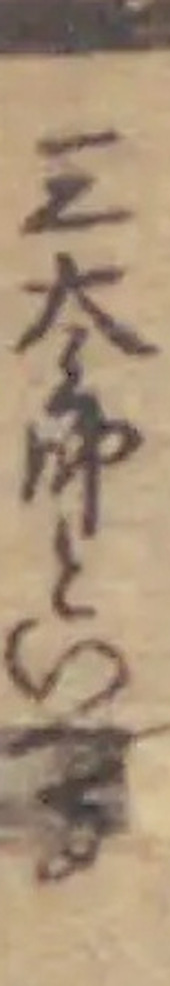三太郎といへる
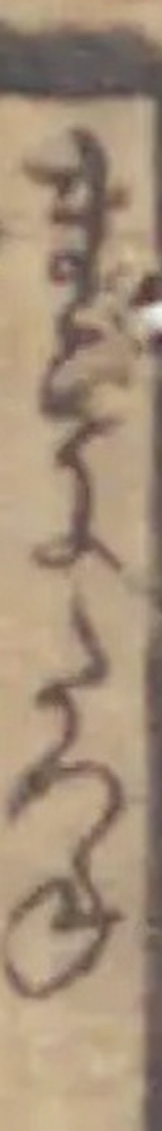まごにたつね
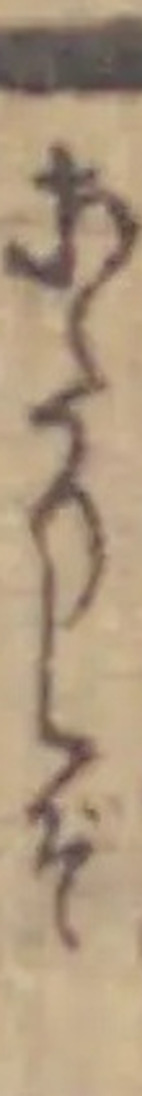あたりしぞ
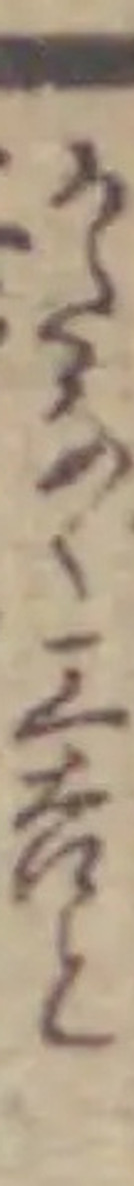かたなく三吉と
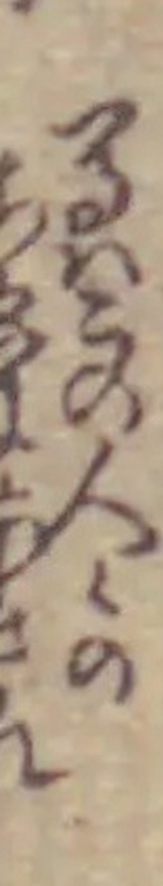馬はこの人々の
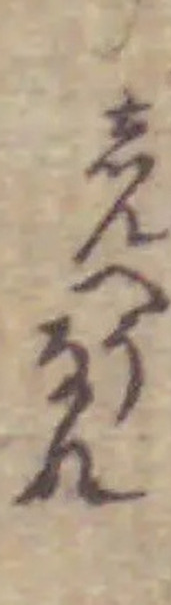しんへう
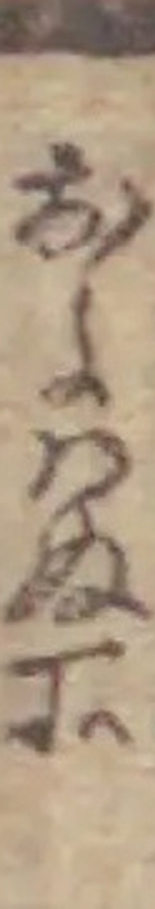およはぬ所
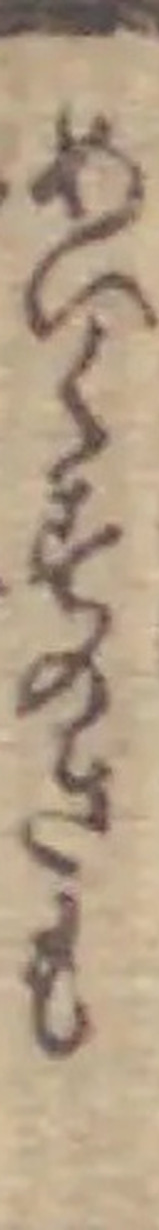めいくすのきも
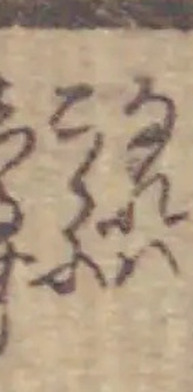なれは

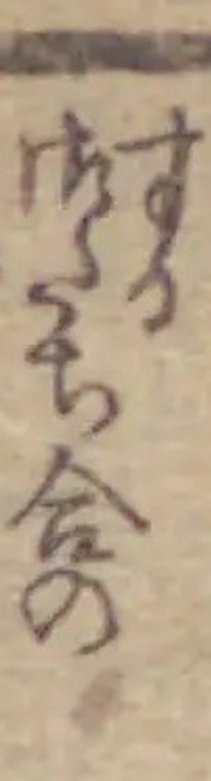御たち合の
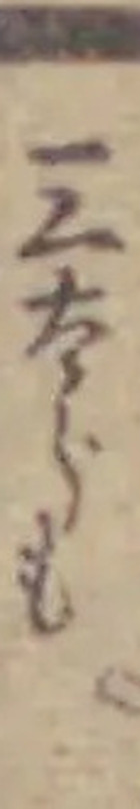三太郎も
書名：道笑双六
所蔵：国立国会図書館 National Diet Library, JAPAN
